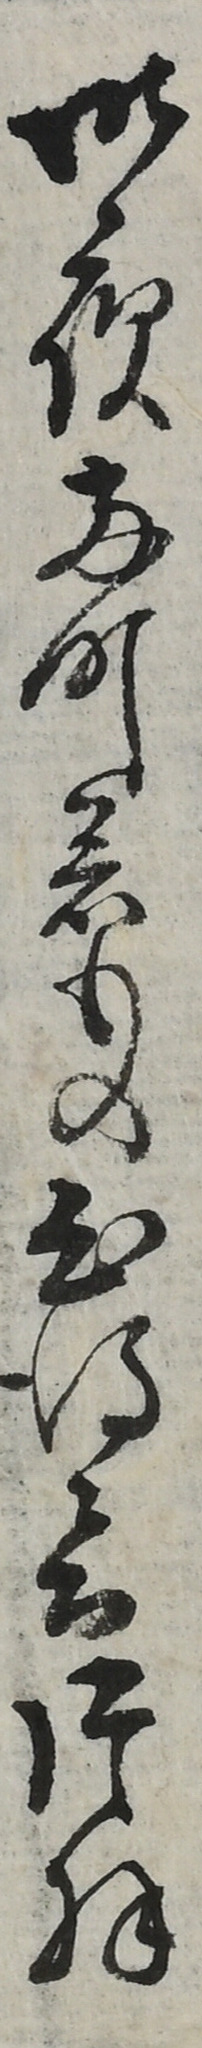昨夜両町若もの心得ニ而片羽
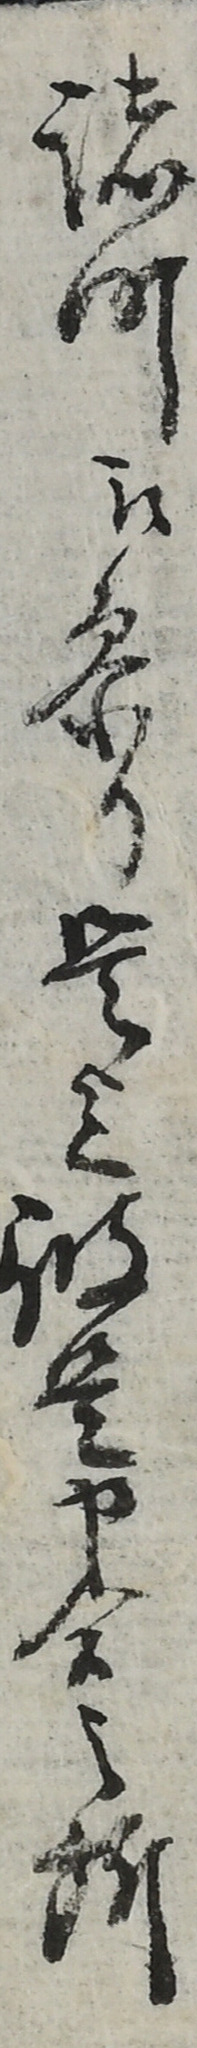諸町江参り是迄彼是申合之所
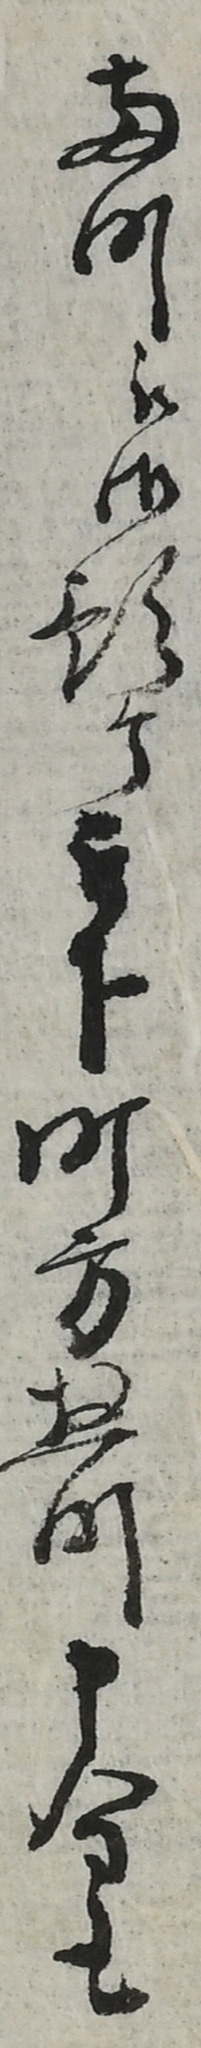両町江御預ヶ被下町方惣町申分も
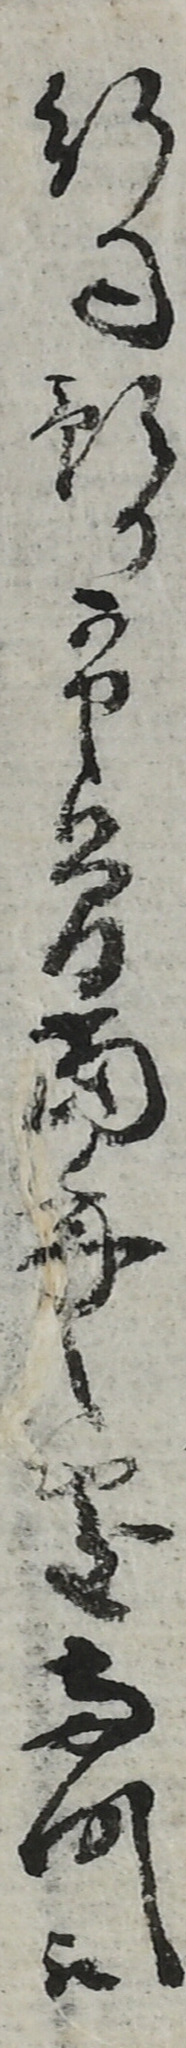行司預り可申候間両年之処両町江
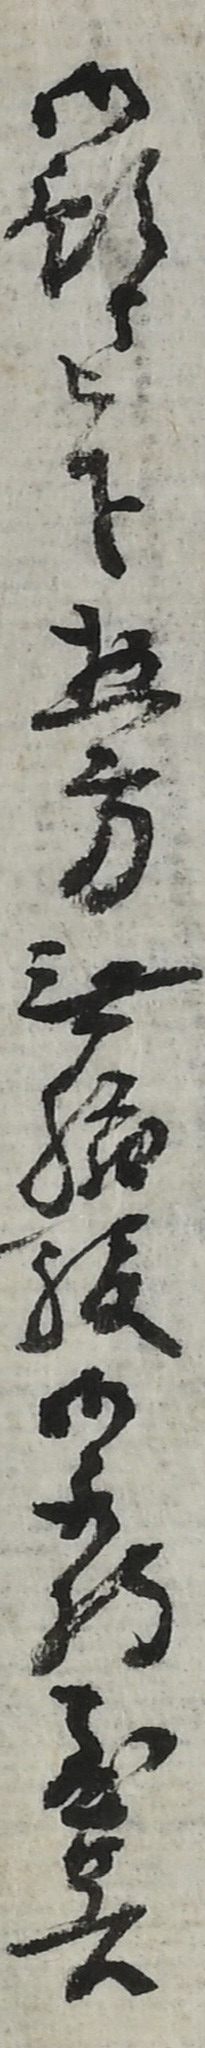御預ヶ被下惣方無臓腹御取持致呉
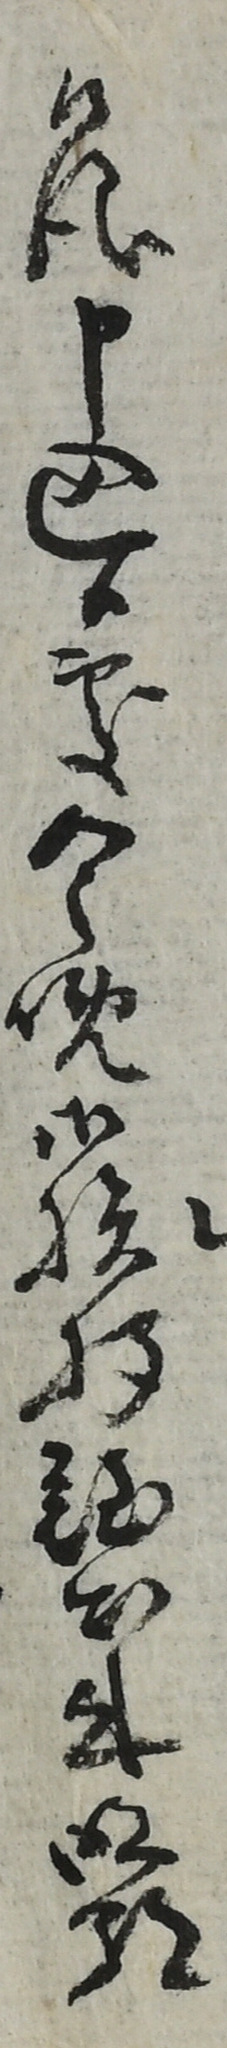候様申込候処今晩御挨拶難出来明朝
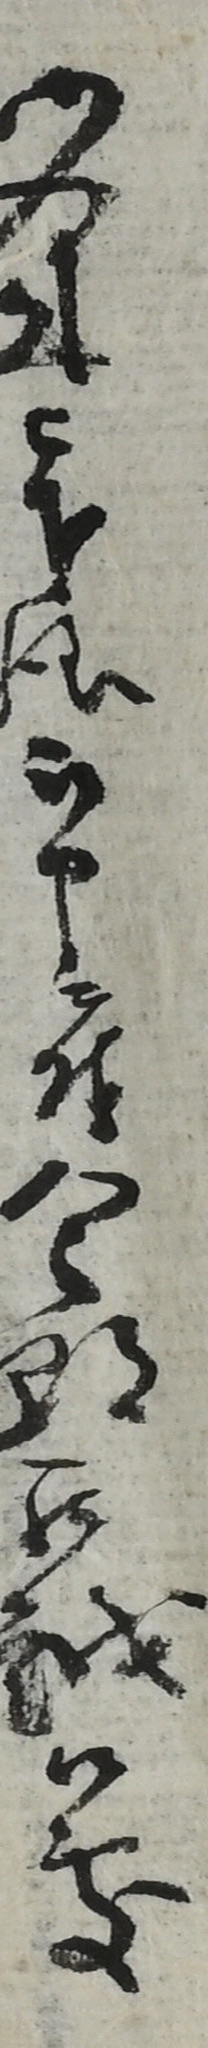御入来被下候様被申ニ付今朝罷越候処

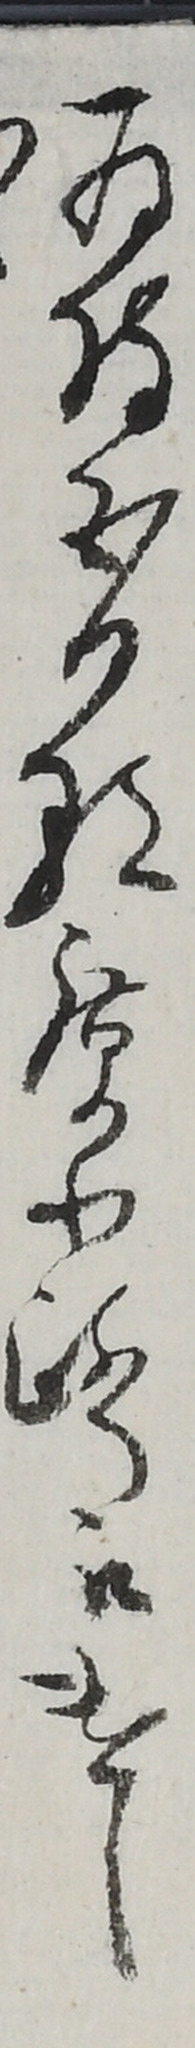為持五ツ朝広小路へ遣し
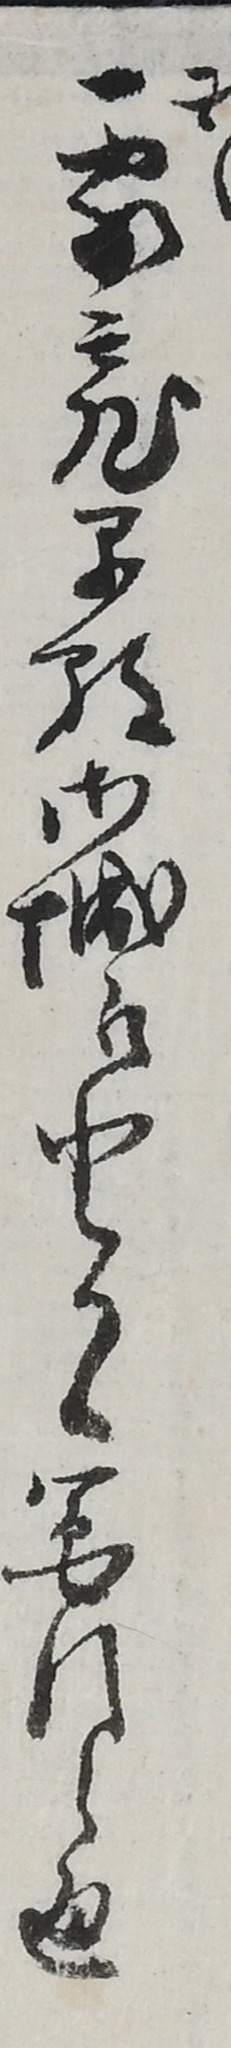一家老早朝御城江登候鬮引之通
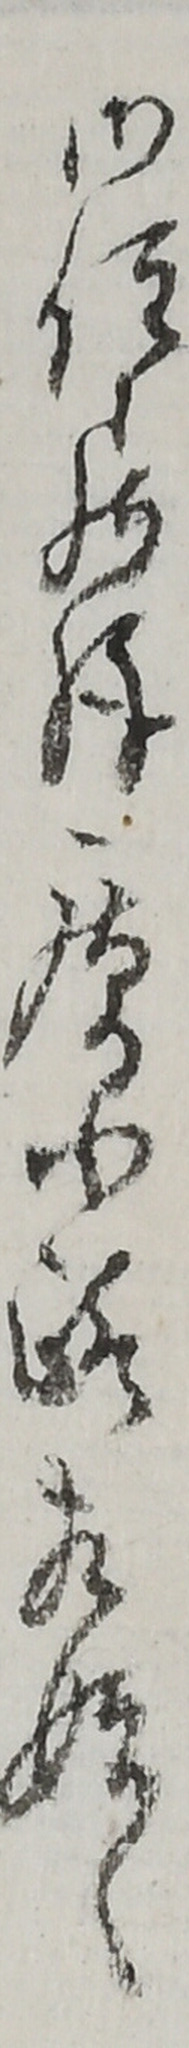御住居様広小路相始候
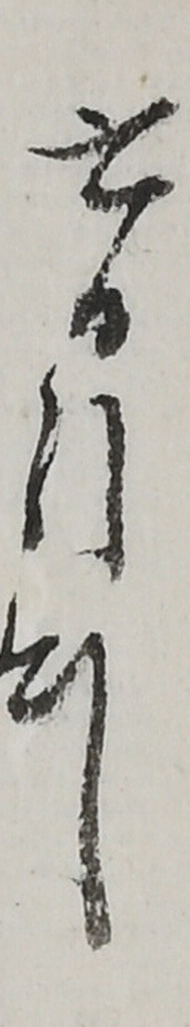六日引出し
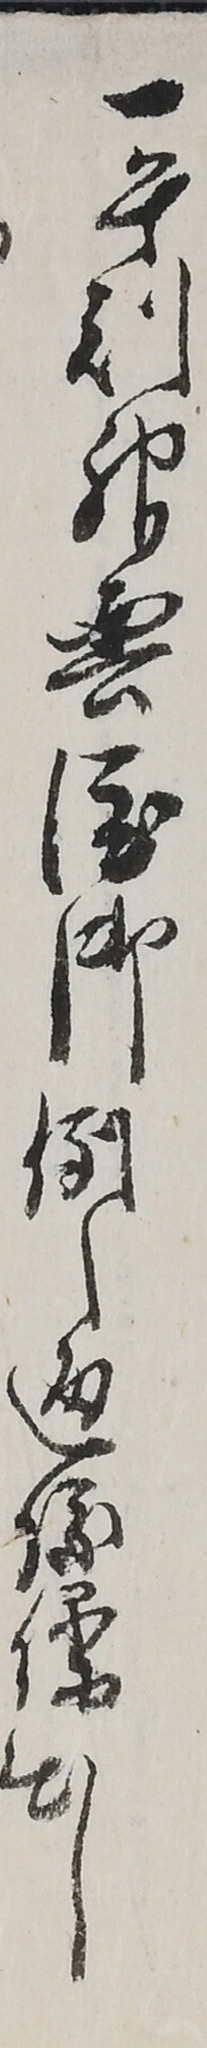一午刻御輿渡御例之通像繰出し
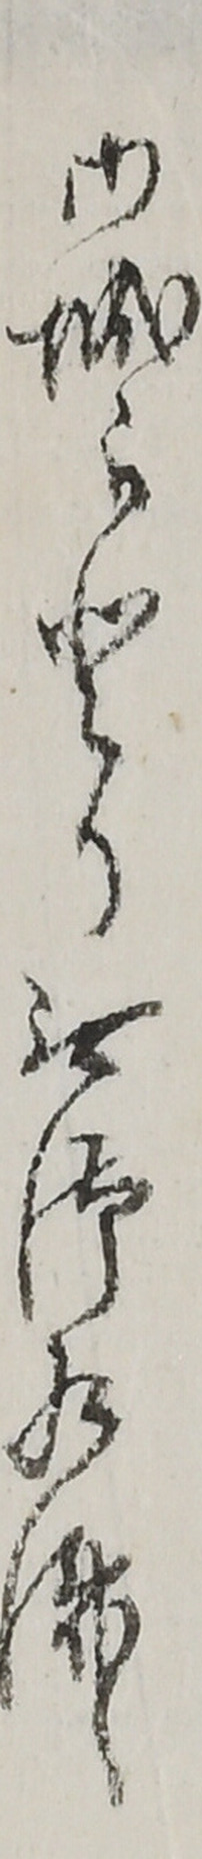御城江登り無滞相滞候
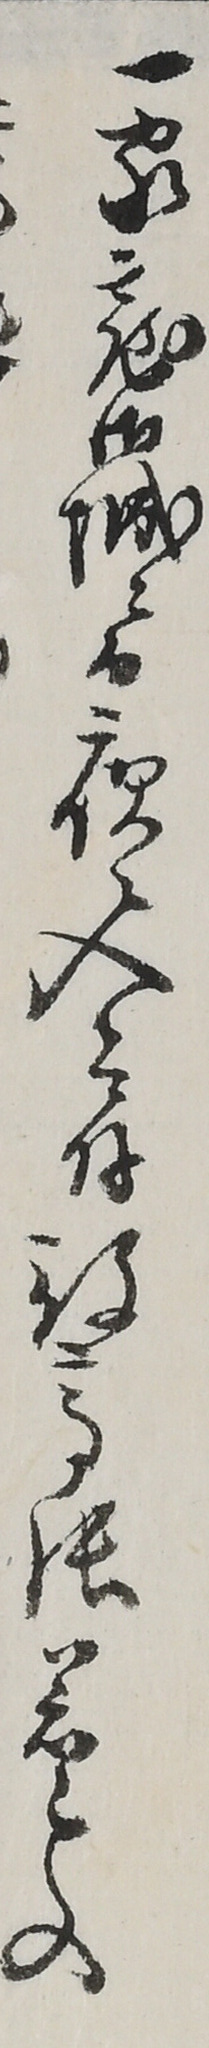一家老御城ニ而夜ニ入候ニ付役高帳若もの
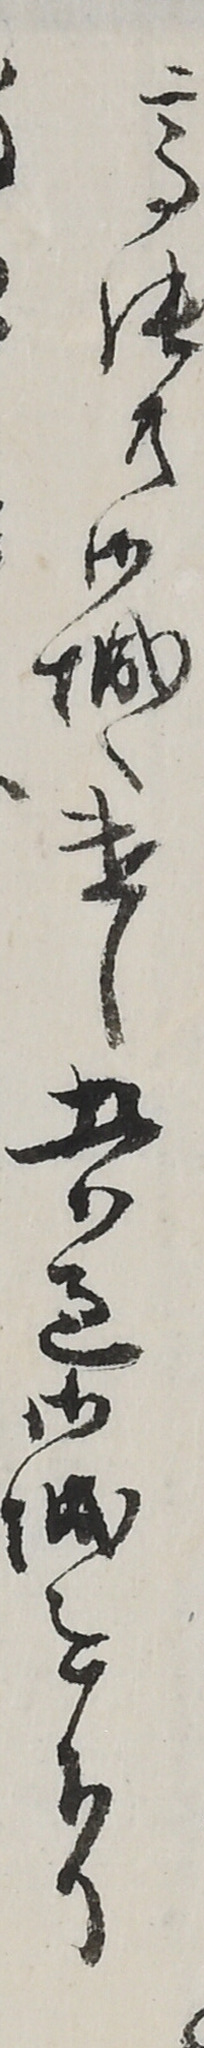高帳共御城へ遣し五ツ過御城を下り
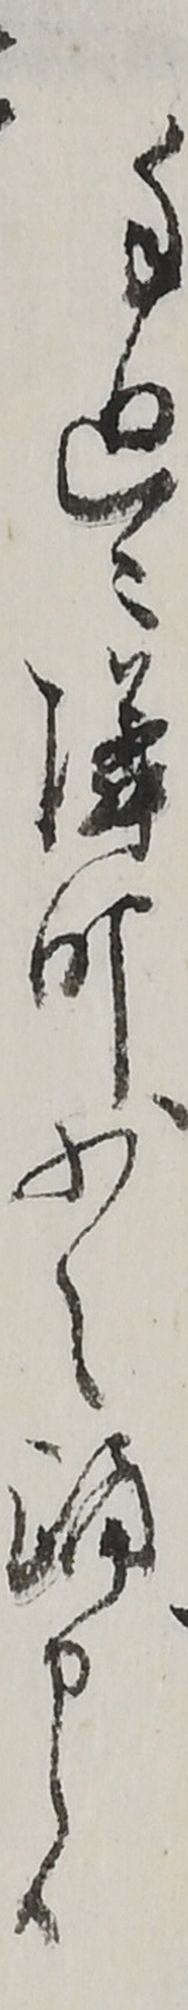手廻ニ隣町少し踊申候
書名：覚書
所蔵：伊那市立高遠町図書館・合同会社AMANE
